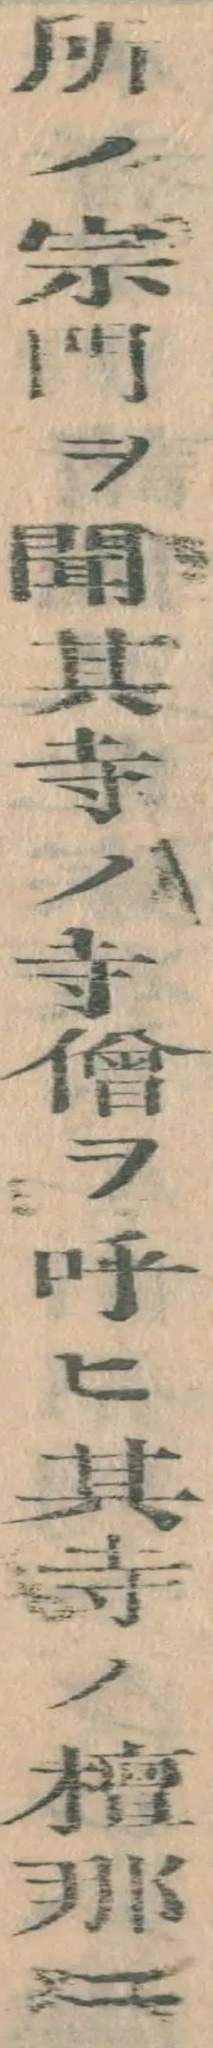所ノ宗門ヲ聞其寺ノ寺僧ヲ呼ヒ其寺ノ檀那ニ
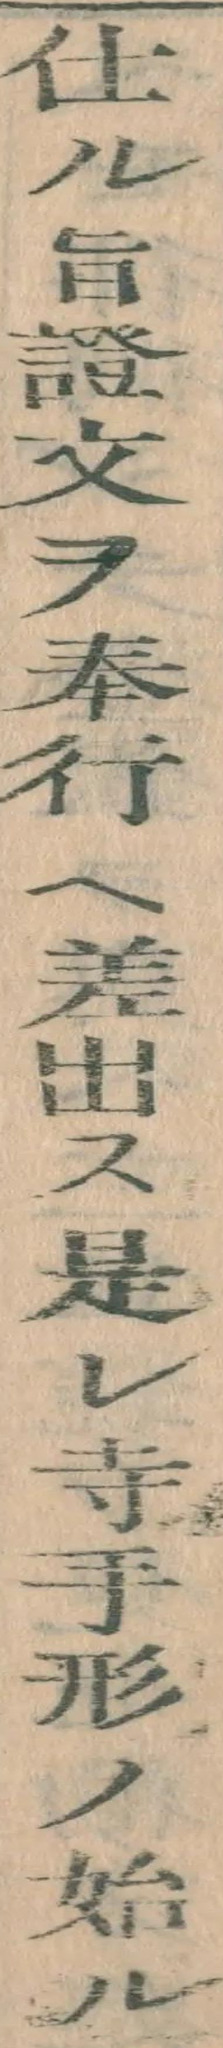仕ル旨証文ヲ奉行ヘ差出ス是レ寺手形ノ始ル
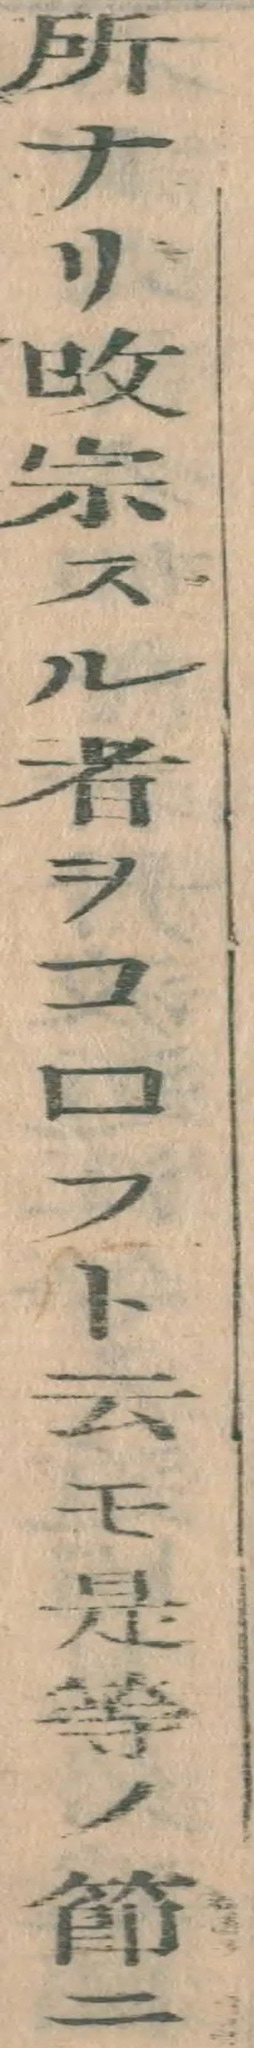所ナリ改宗スル者ヲコロフト云モ是等ノ節ニ
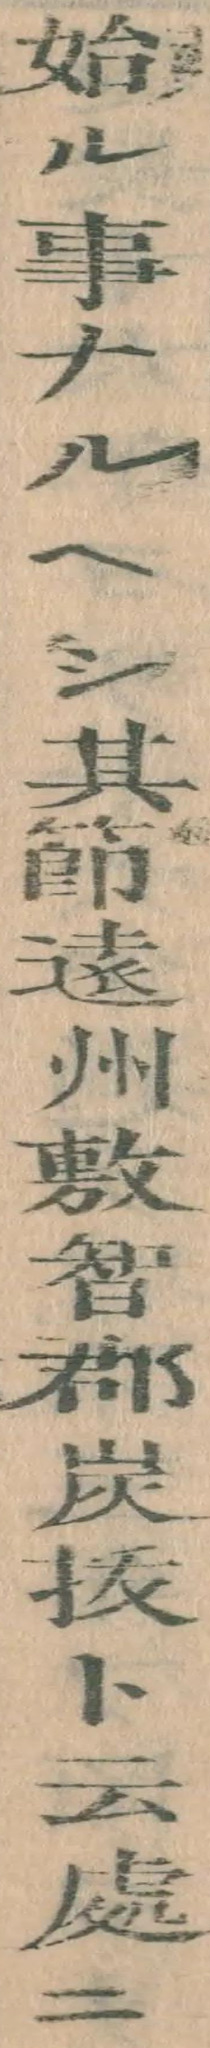始ル事ナルヘシ其節遠州敷智郡炭抜ト云処ニ
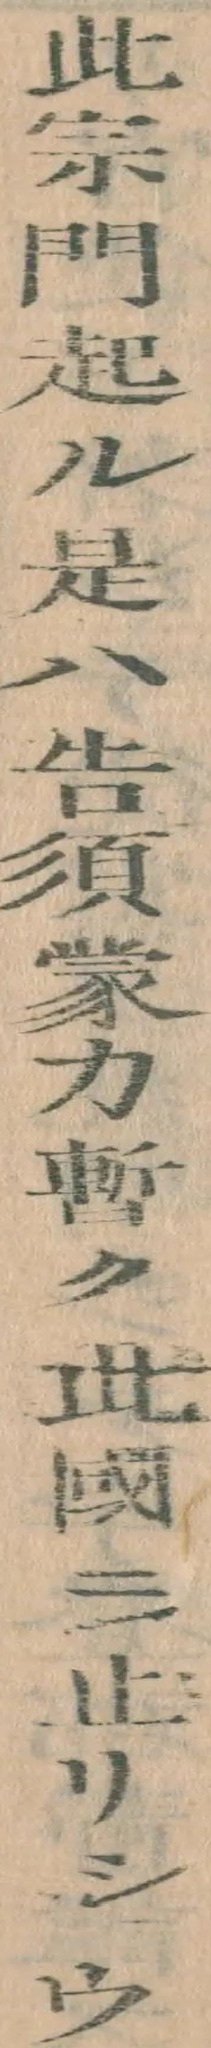此宗門起ル是ハ告須蒙カ暫ク此国ニ止リシウ
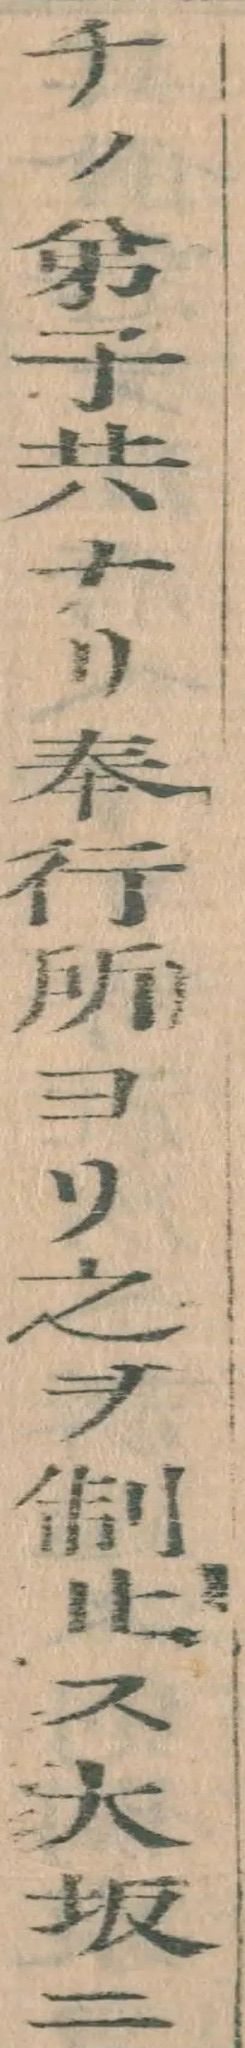チノ弟子共ナリ奉行所ヨリ之ヲ制止ス大坂ニ
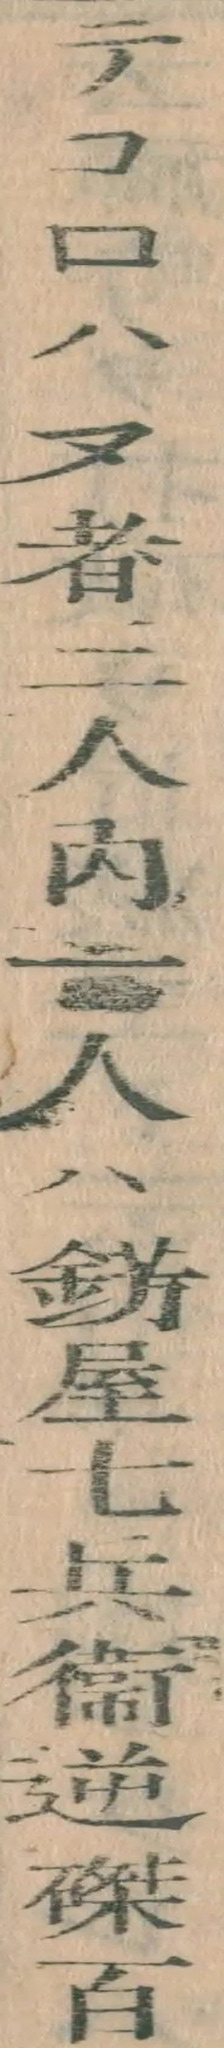テコロハヌ者三人内一人ハ錺屋七兵衛逆磔百
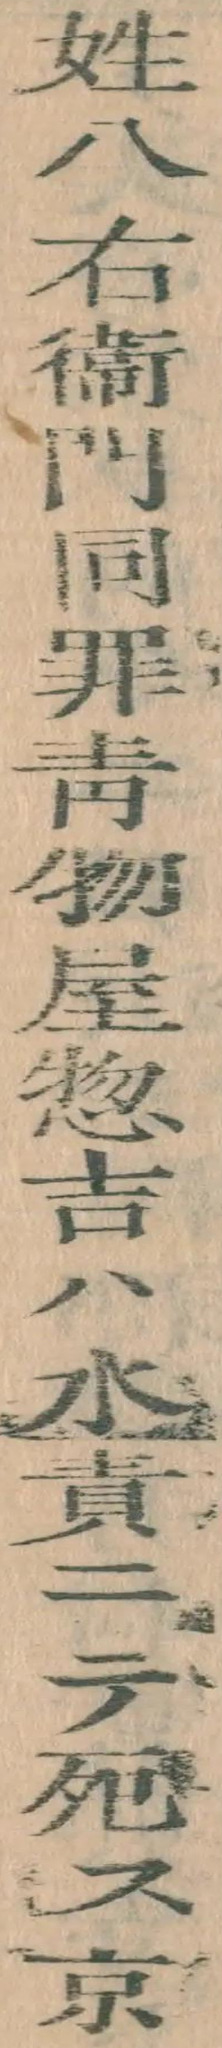姓八右衛門同罪青物屋惣吉ハ水責ニテ死ス京
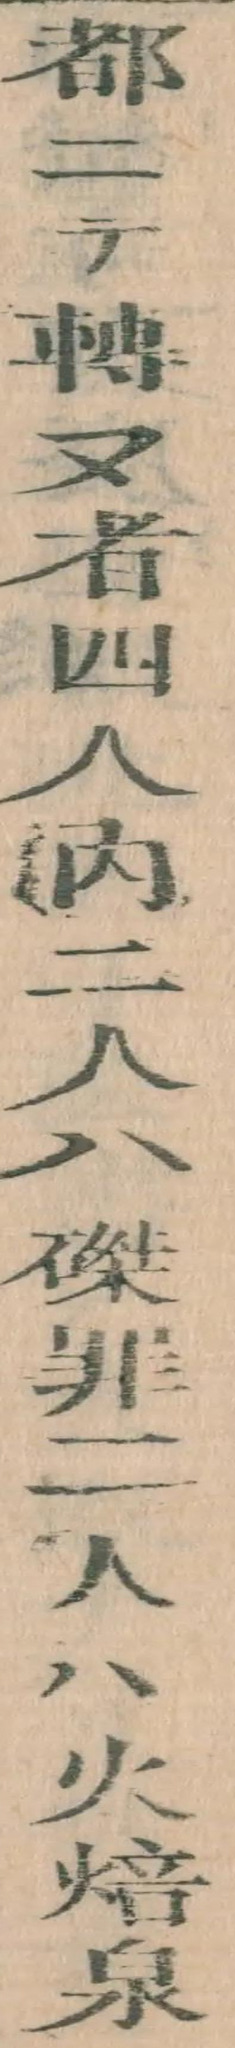都ニテ転ヌ者四人内二人ハ磔罪二人ハ火焙泉
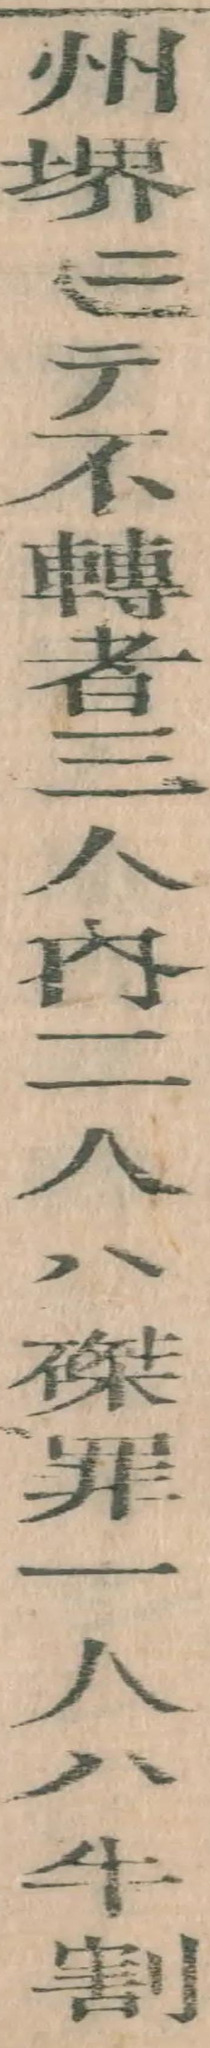州堺ニテ不転者三人内二人ハ磔罪一人ハ牛割
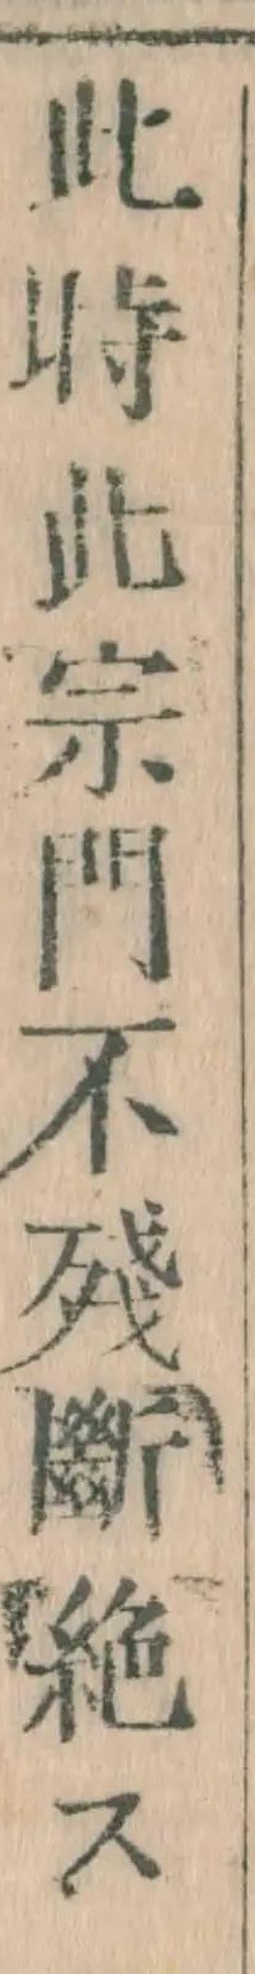此時此宗門不残断絶ス
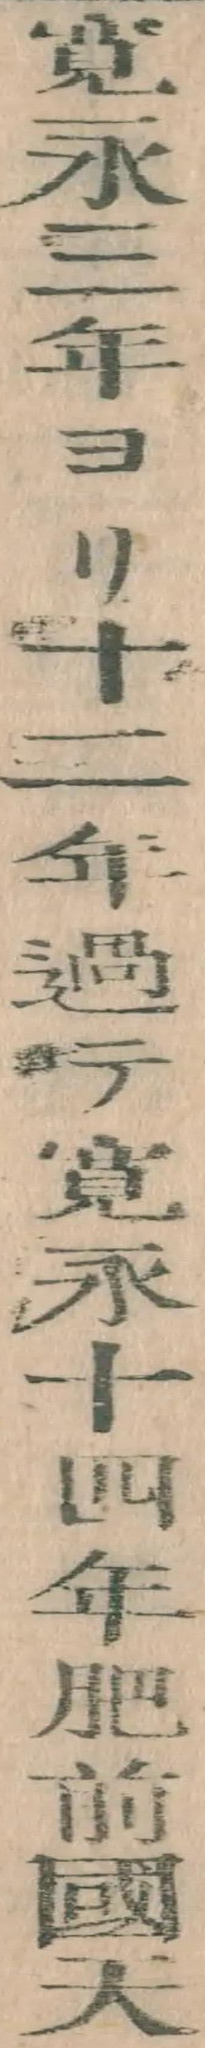寛永三年ヨリ十二年過テ寛永十四年肥前國天
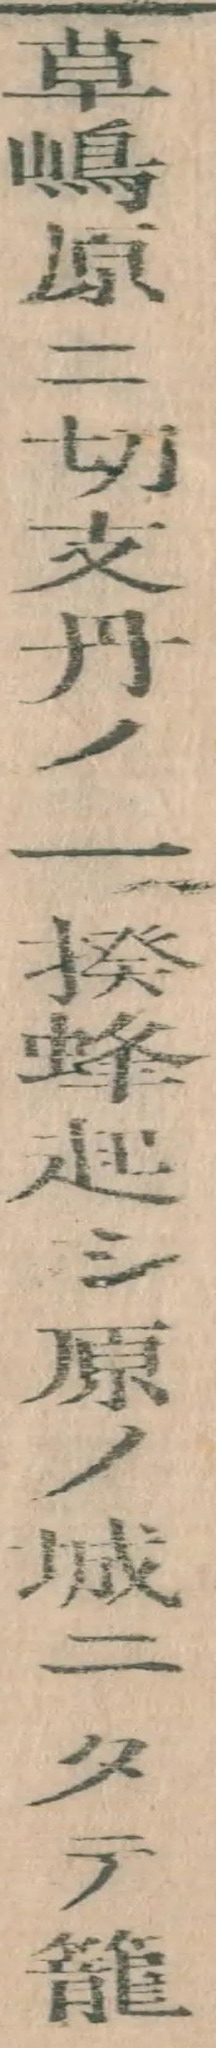草島原ニ切支丹ノ一揆蜂起シ原ノ城ニタテ籠
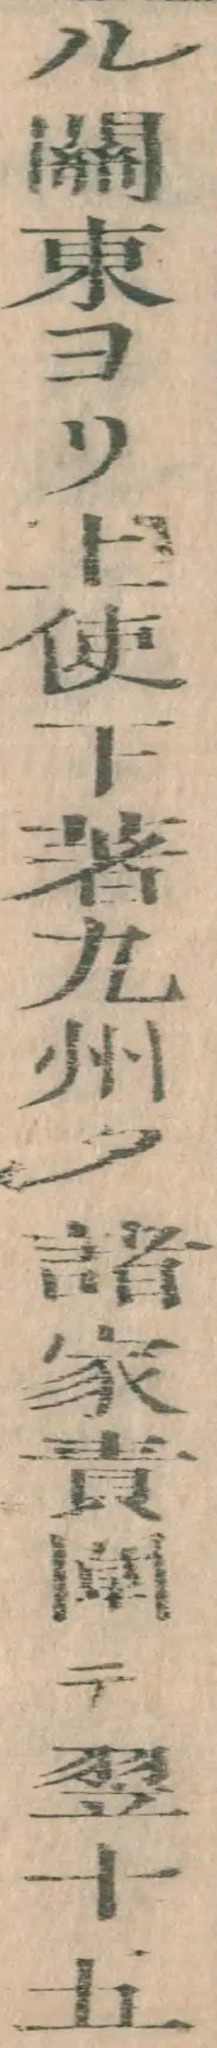ル関東ヨリ上使下著九州ノ諸家責囲テ翌十五
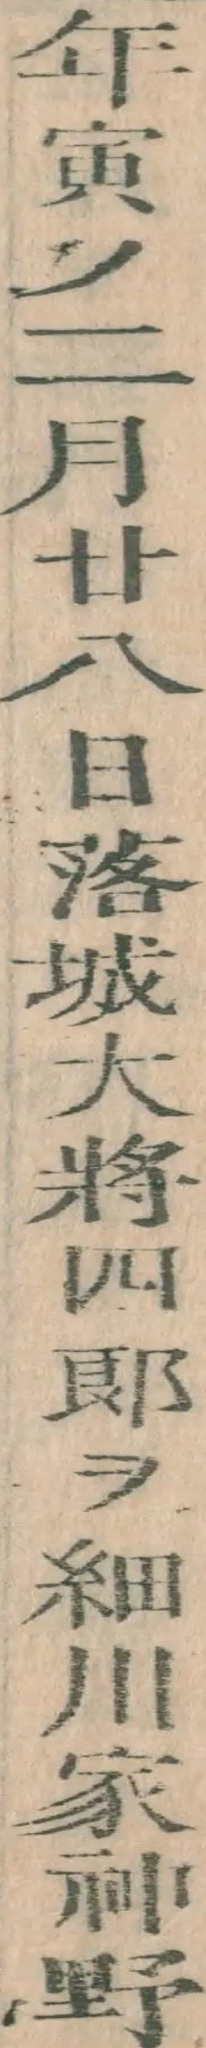年寅ノ二月廿八日落城大将四郎ヲ細川家神野
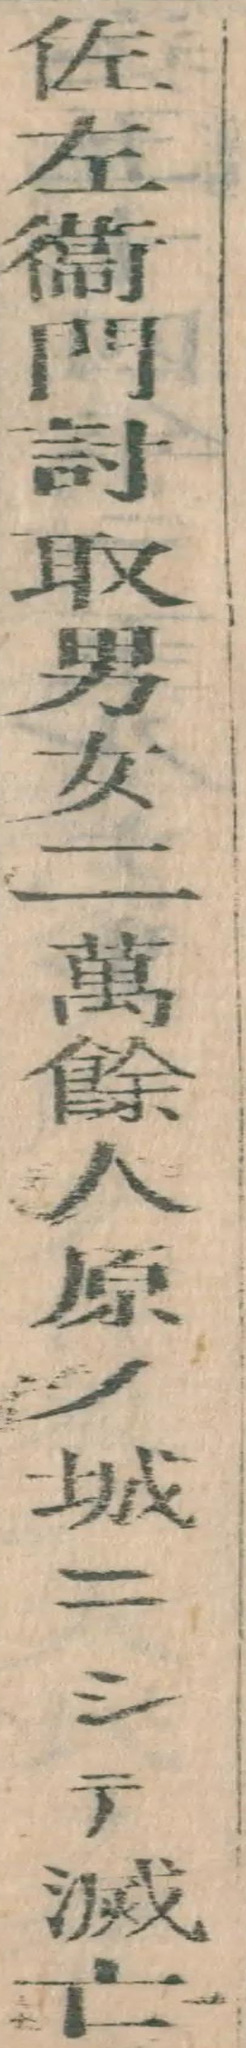佐左衛門討取男女二万余人原ノ城ニシテ滅亡
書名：南蛮寺興廃記
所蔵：国立国会図書館 National Diet Library, JAPAN
